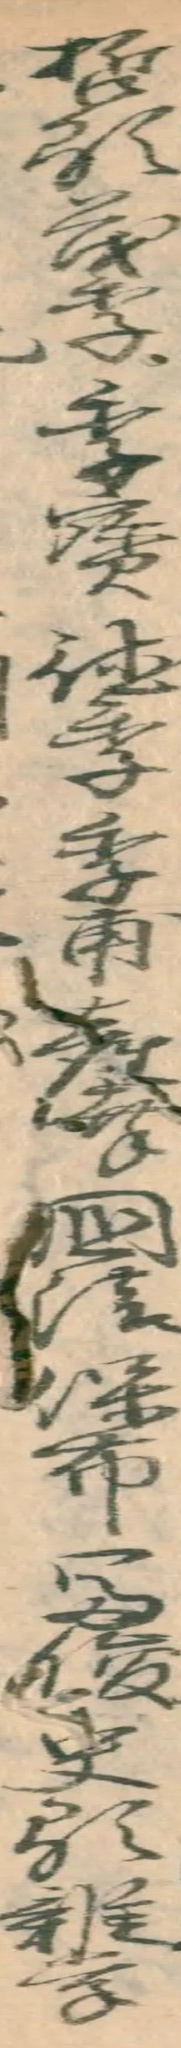哲顕茂季宝徳季季甫産幸国清保布富俊史顕雑掌
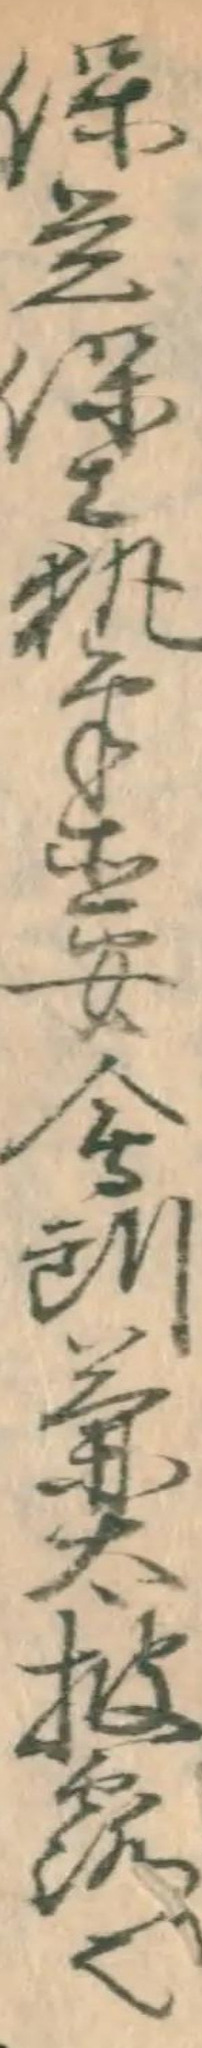保覚保土執筆直安会所兼太披露也
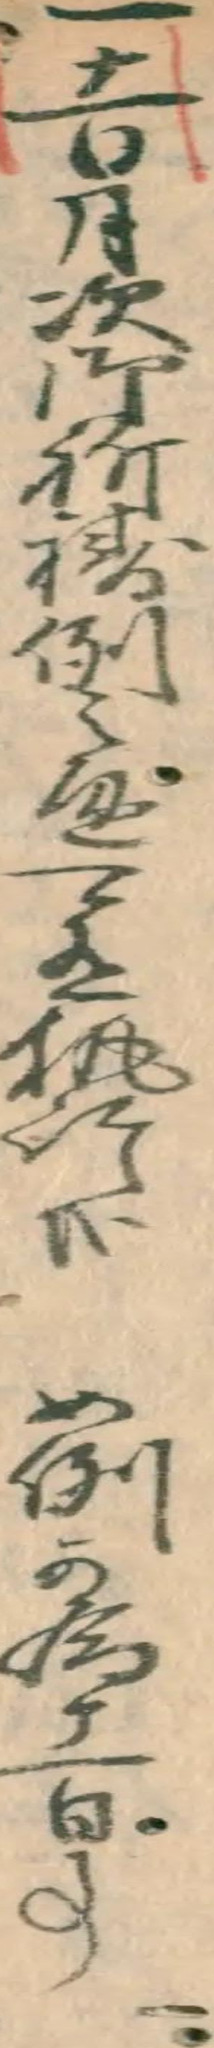一十一日月次御祈祷例之通可有執行候哉如例可為十一日事
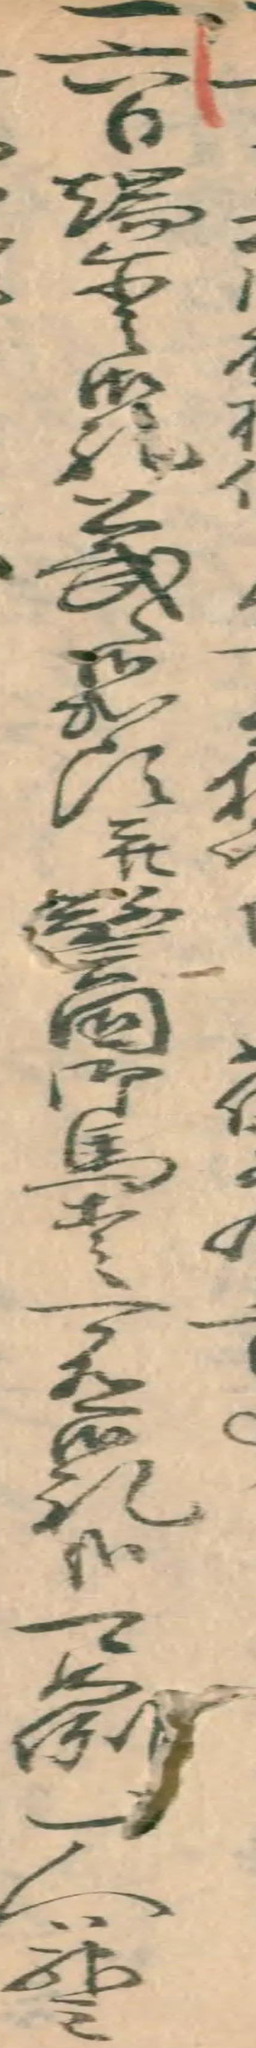一六日端午之御礼公武へ御出頭并警固御馬等之可有御礼哉可為例一人ハ神主
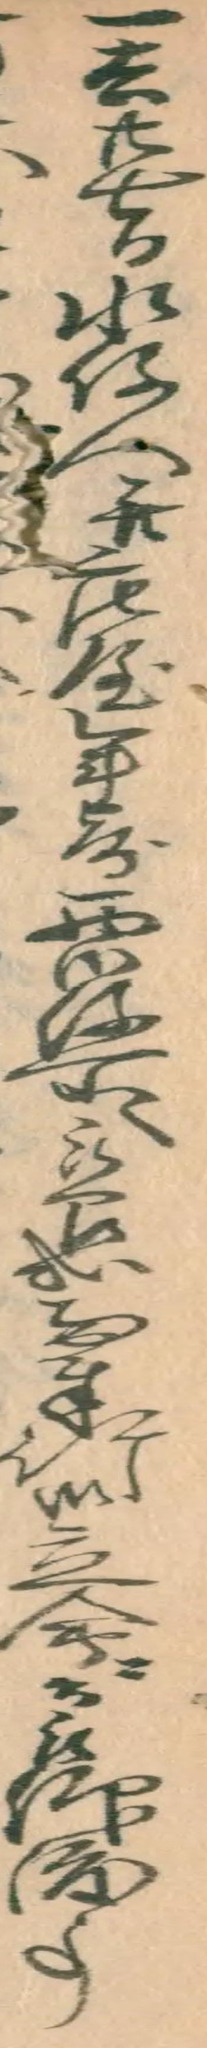一去廿七日水役人并庄屋年寄西御役所へ被召出両奉行御立会ニ而被仰渡候事
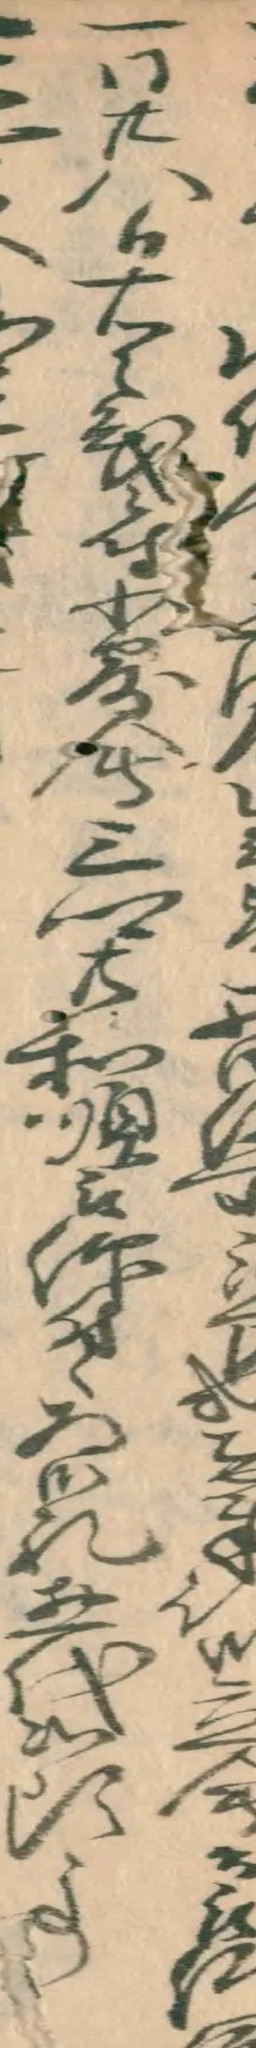一同廿八日右之義ニ付小寄会三郷共和順被仰付候為御礼惣代出頭候事
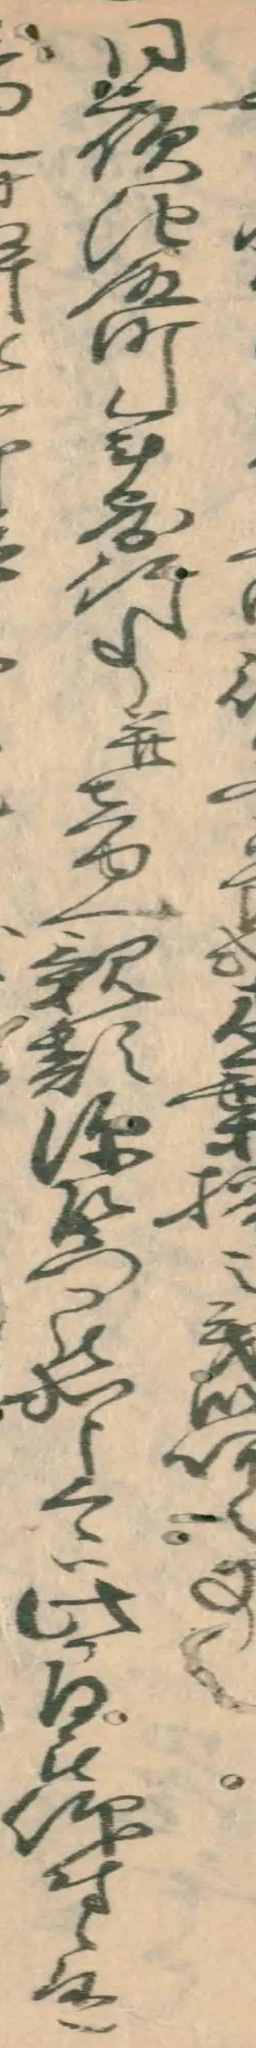一同夜池尻町年寄行事并寄人親類源左衛門罷出申上候ハ此間被仰付候通
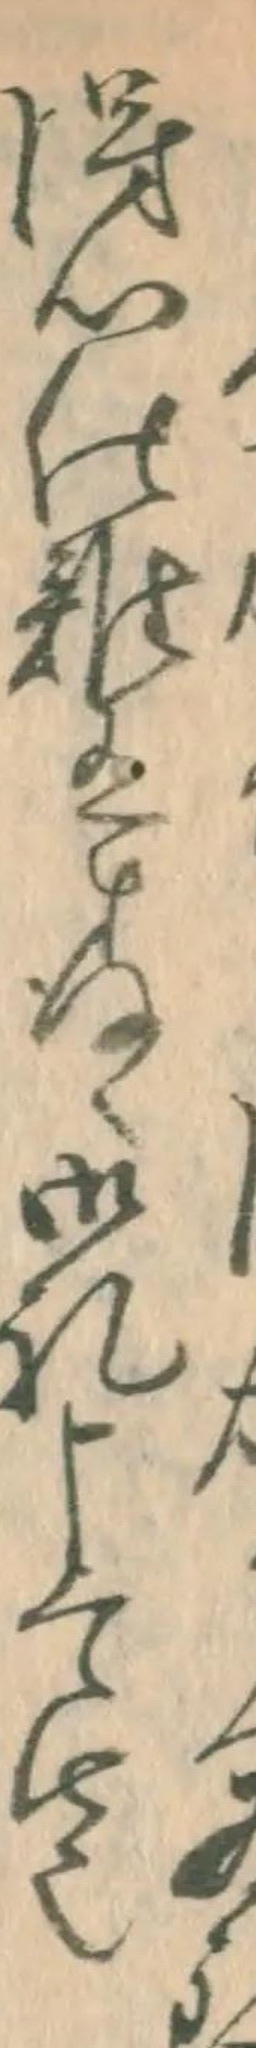得心仕難有奉存候御礼申上候由也
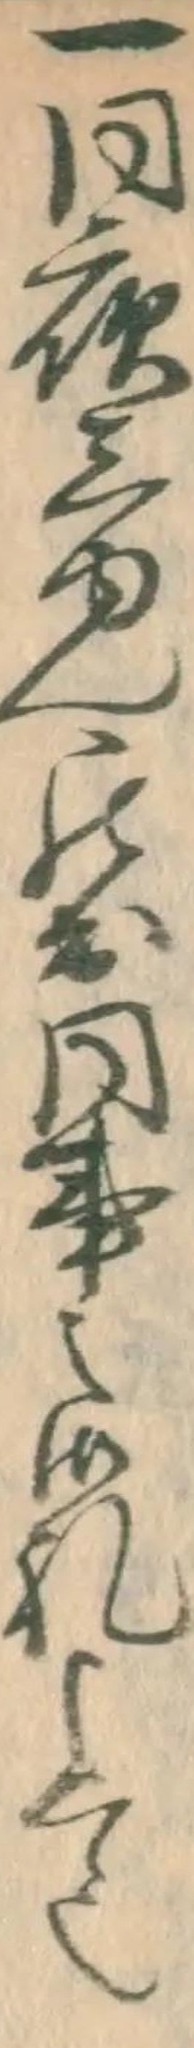一同夜罷出同事之御礼申上候也
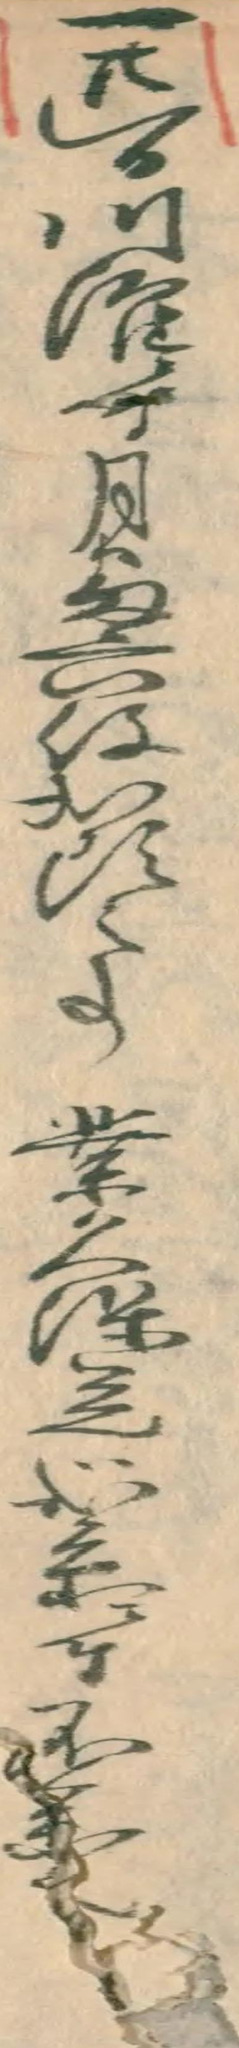一廿一日川濯ニ付月番六役出頭之事業久保覚ハ出京ニ付不参也
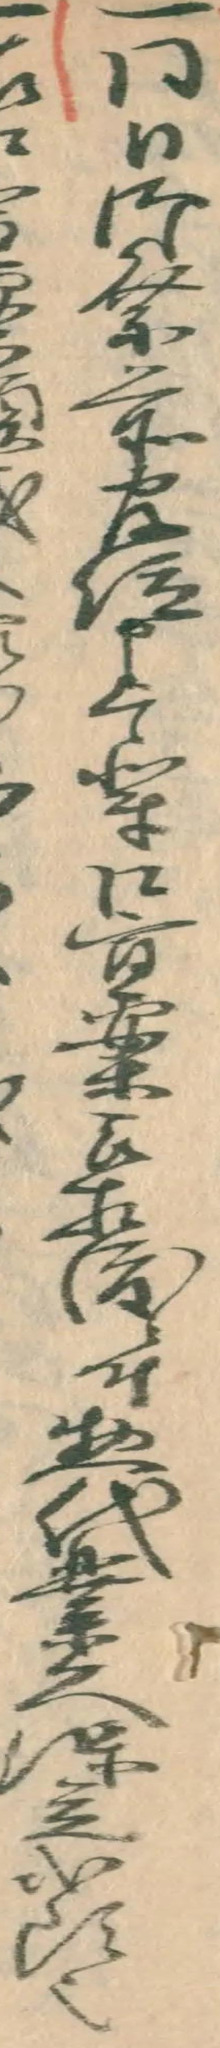一同日御祭前官位申上候輩口宣案被相渡ニ付惣代業久保覚出頭也
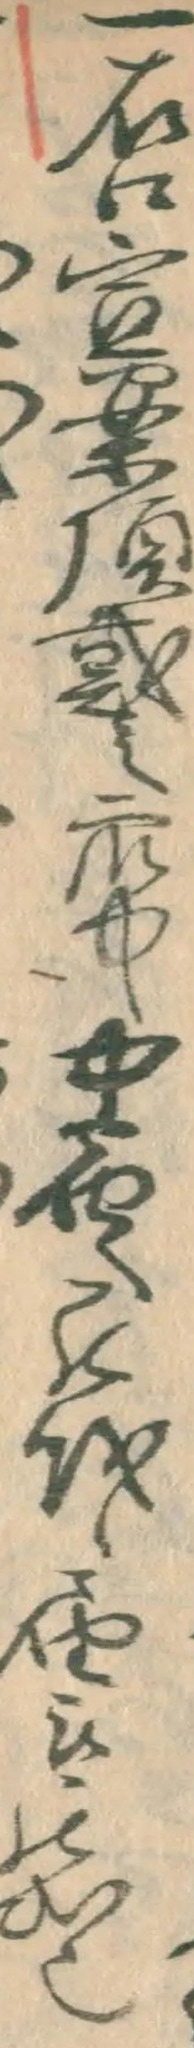一右口宣案頂戴之衆中中宿へ罷越候届被罷出也
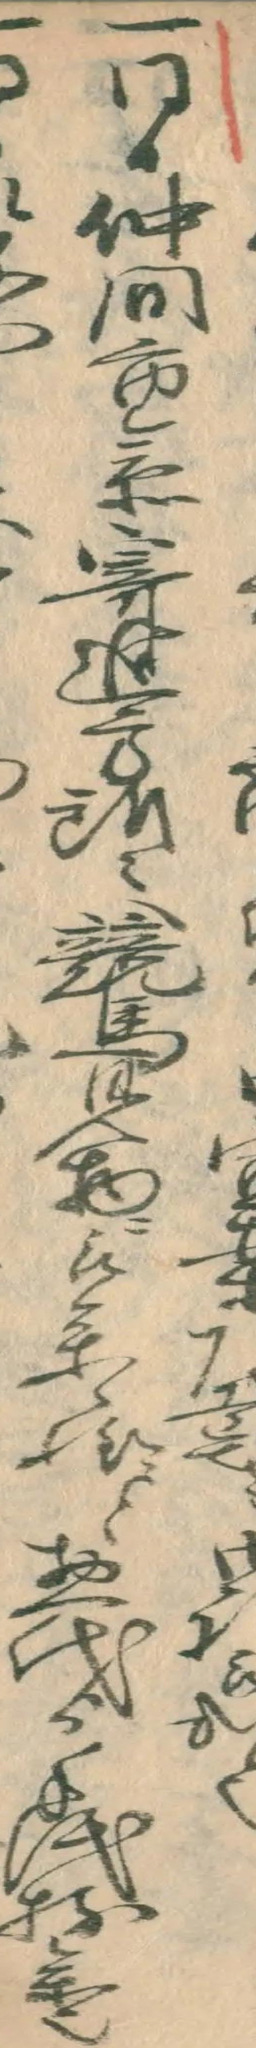一同日仲間市兵衛寄進方所々へ競馬見物ニ被参候様ニと惣代ゟ手紙持参也
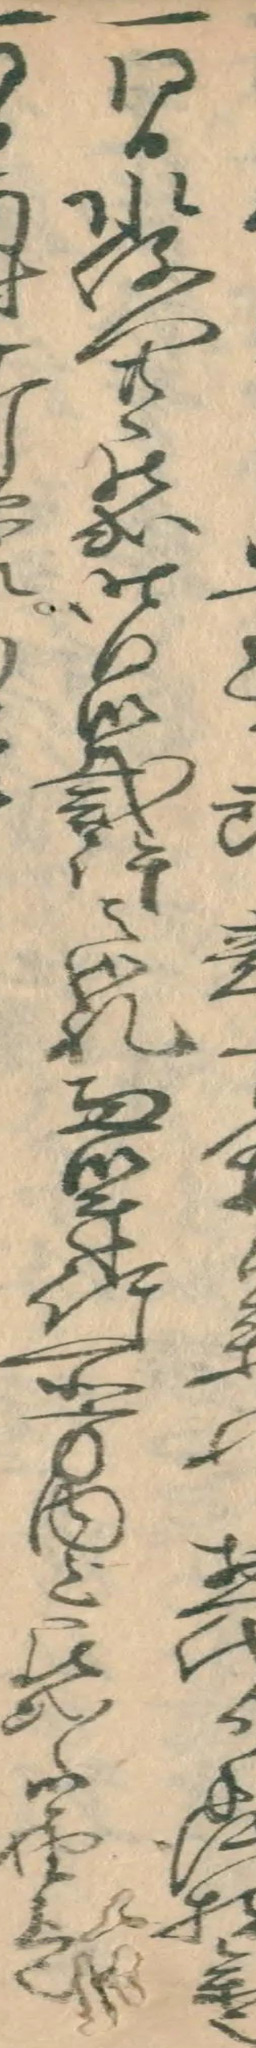一同日水役人共罷出昨日御裁許之御礼惣御奉行所方内迄罷出候御届上也
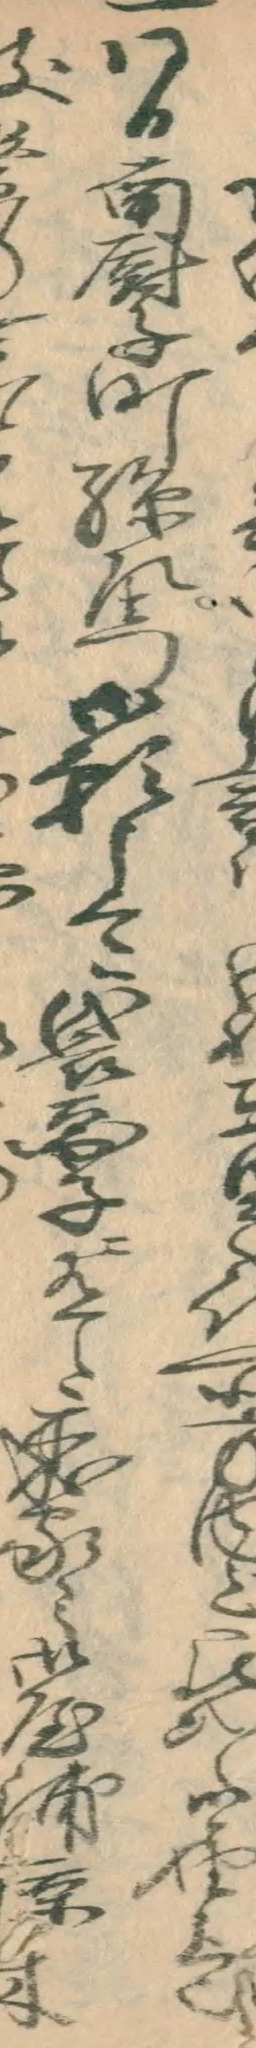一同日南厨子町孫左衛門御願申上候ハ袋図子ニ有之候森家之御屋鋪椋ノ木
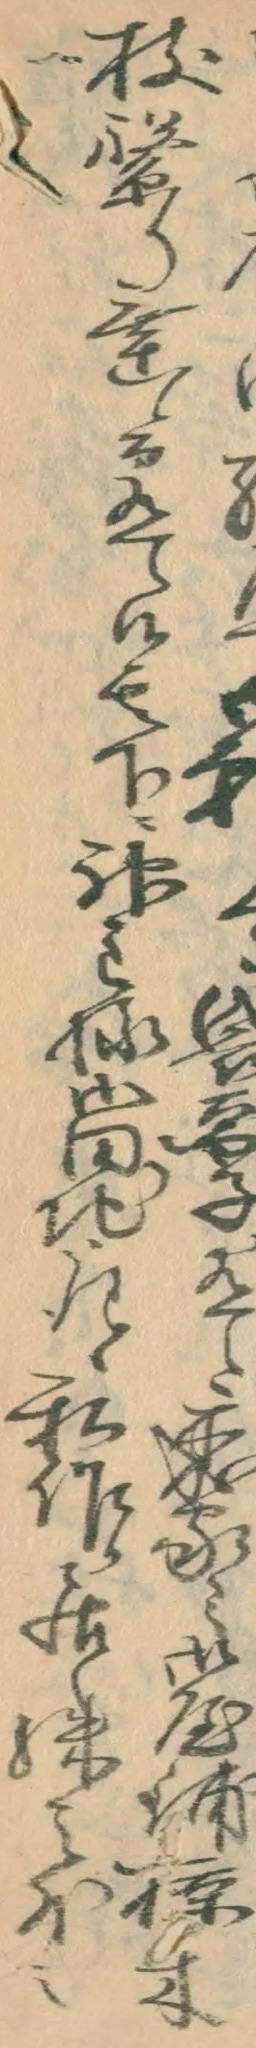枝繋り垂候而有之候其下ニ神主様御田地御座候私作り居殊之外之
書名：賀茂社記録. 第58冊
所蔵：国立国会図書館 National Diet Library, JAPAN
